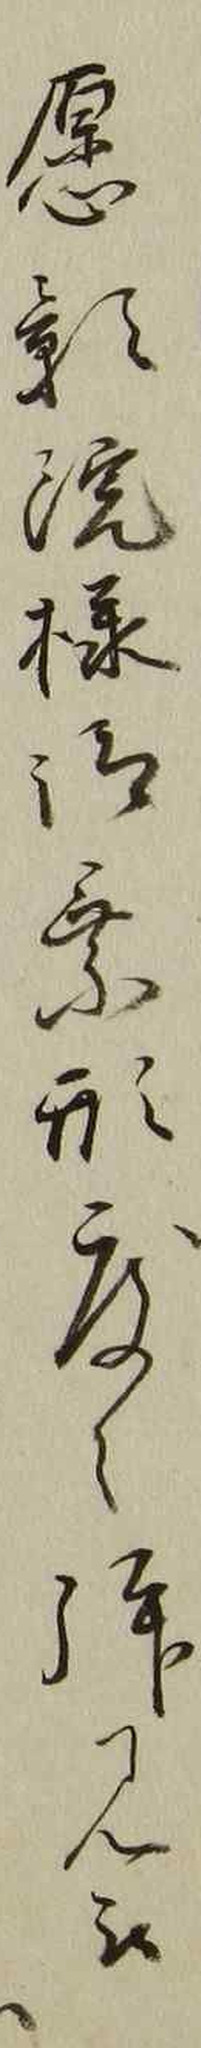愿彰院様御乗形度々拝見被
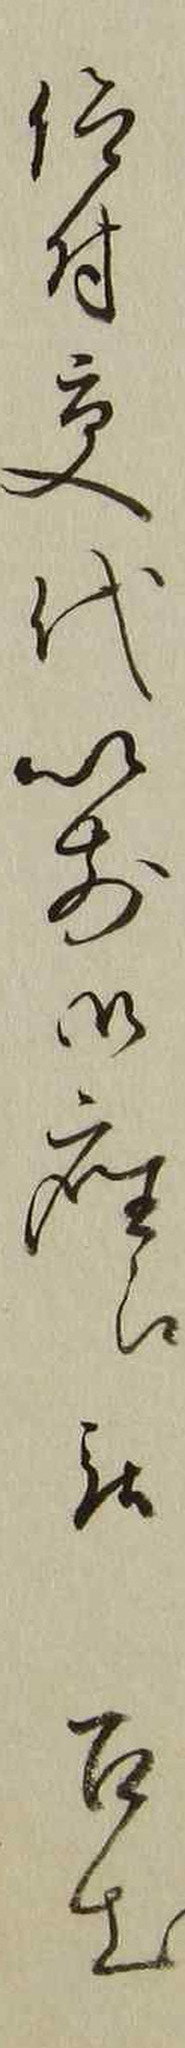仰付交代以前御座江被召出
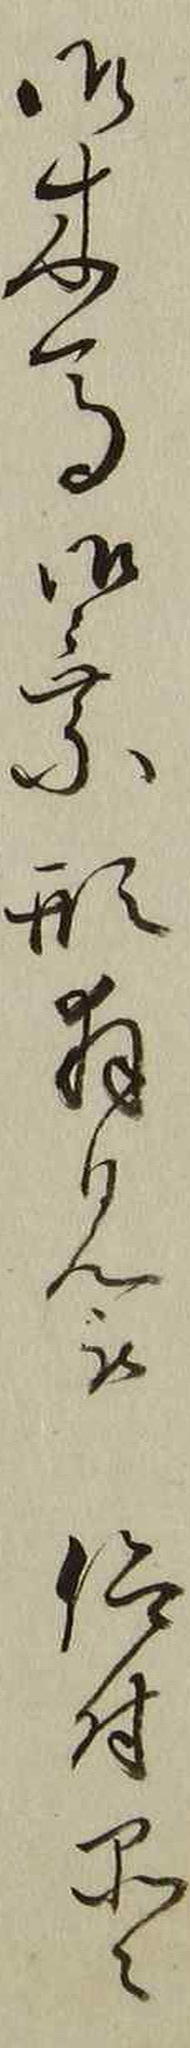御木馬御乗形拝見被仰付品々
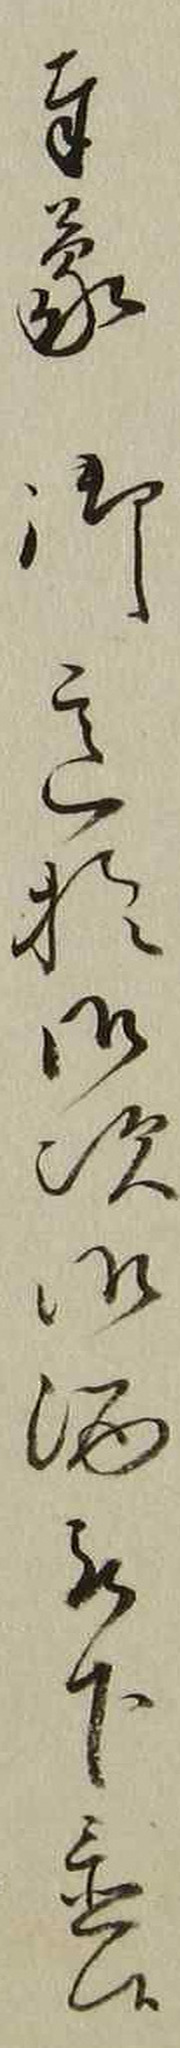奉蒙御意於御次御酒被下置候
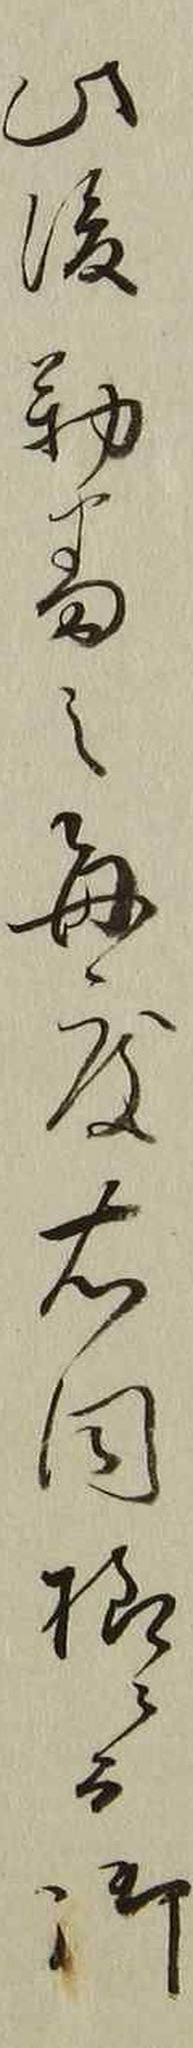此後勤番之毎度右同様ニ而御
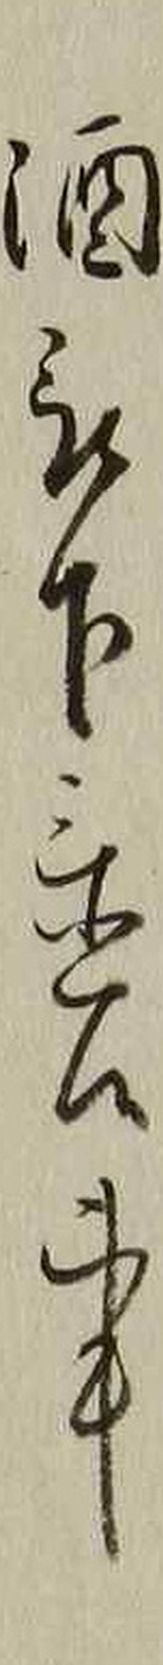酒被下置候事
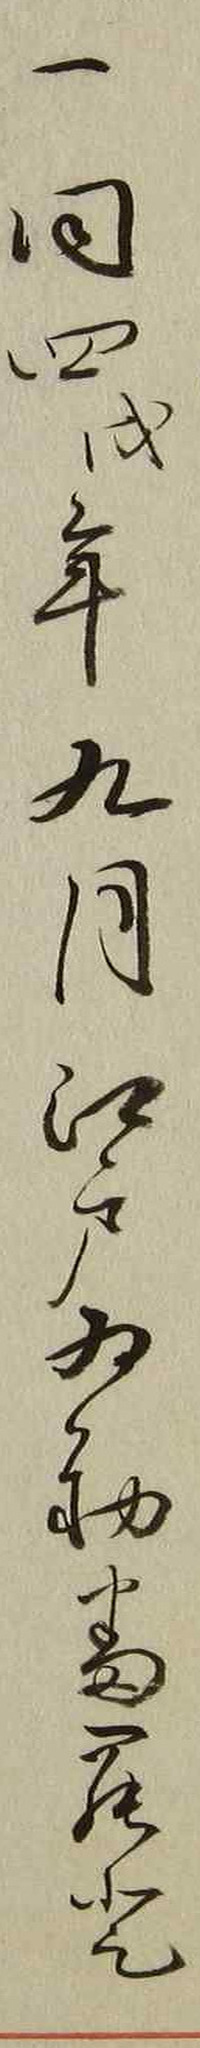一同四戌年九月江戸為勤番罷登
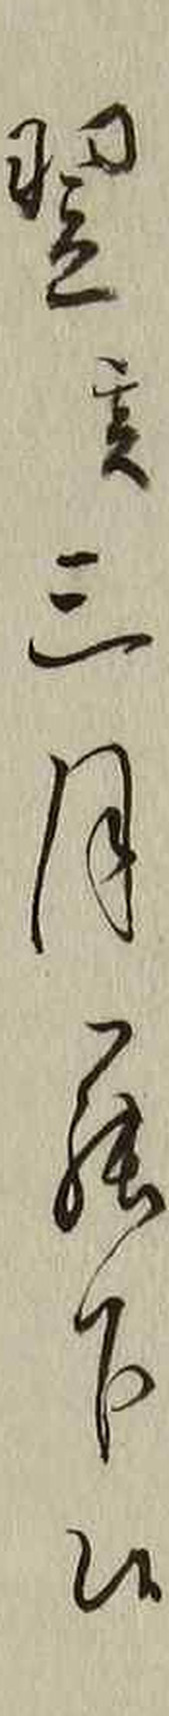翌亥三月罷下候
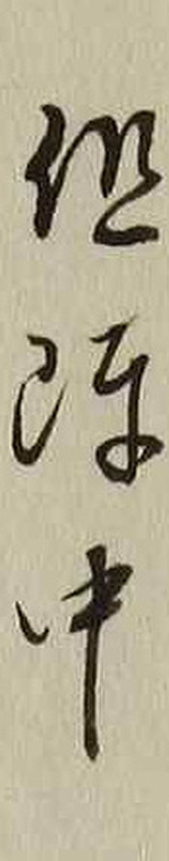但陣中
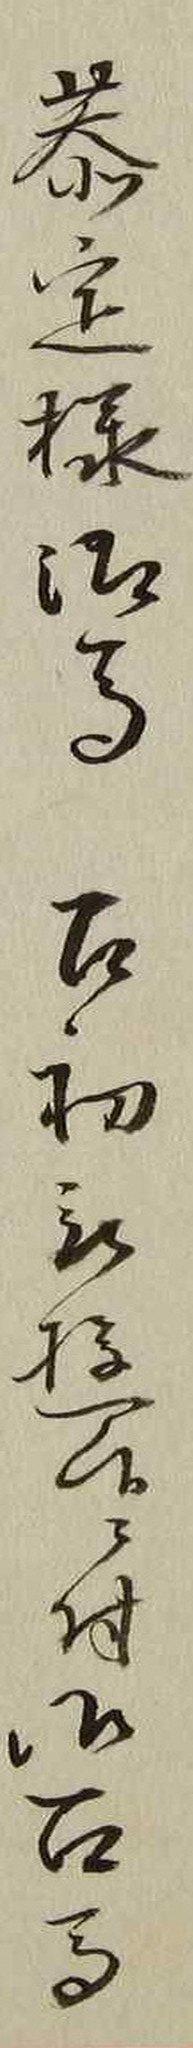恭定様御馬召初被遊候ニ付御召馬
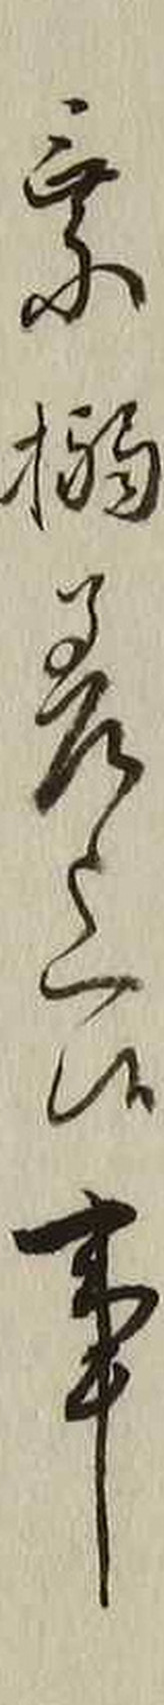乗搦差上候事
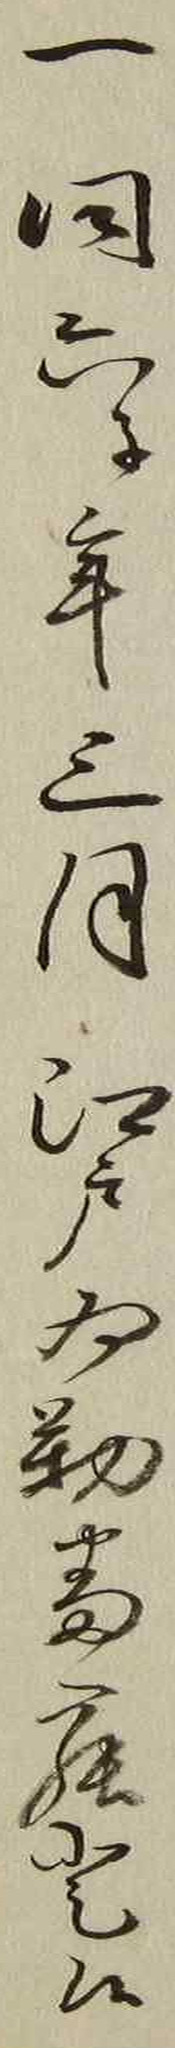一同六子年三月江戸為勤番罷登候
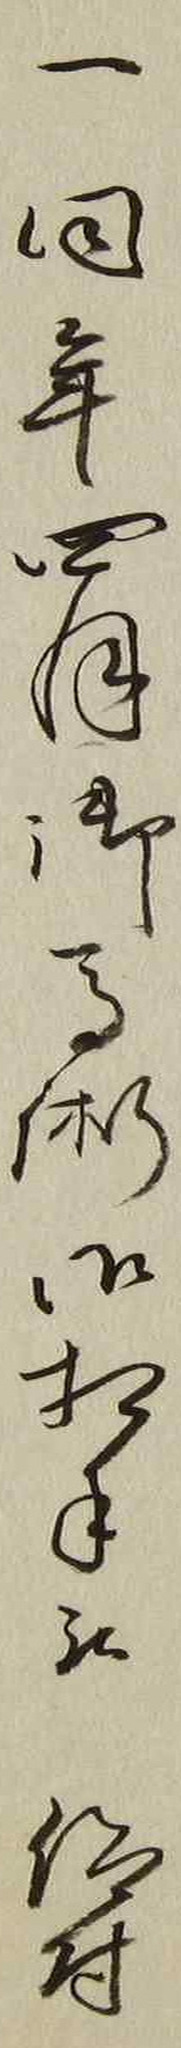一同年四月御馬術御相手被仰付
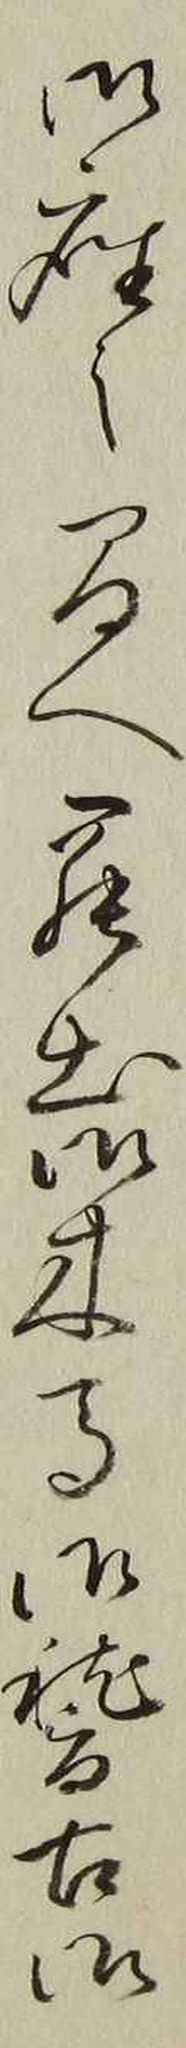御座之間へ罷出御木馬御稽古御
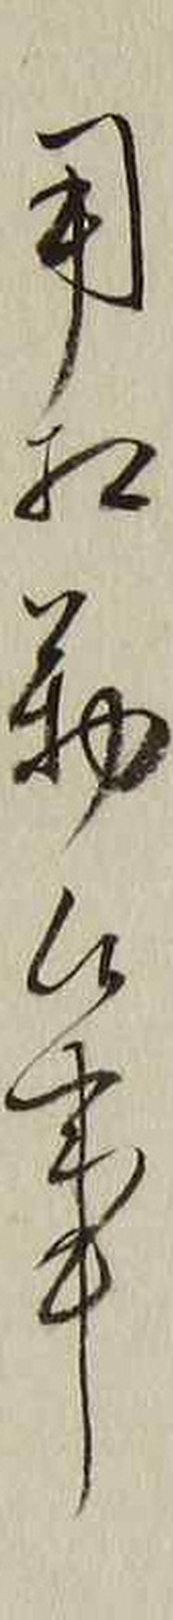用相勤候事
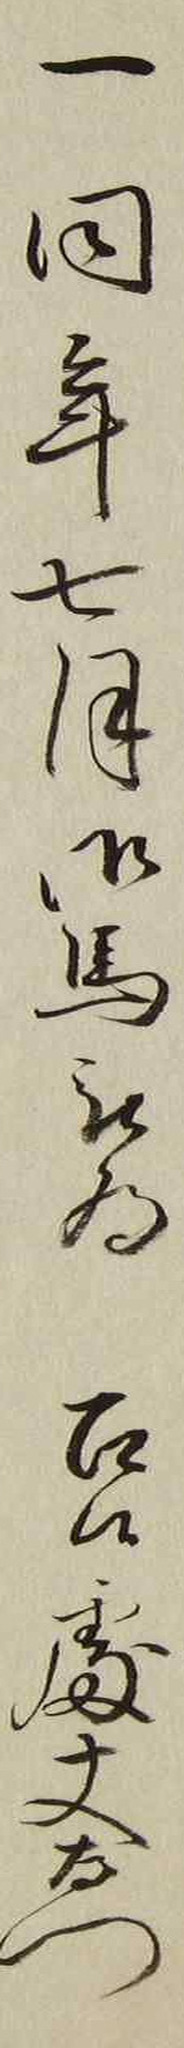一同年七月御馬被為召候処丈右衛門
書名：諸士系譜　巻之3　い之部3
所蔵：会津若松市立会津図書館
